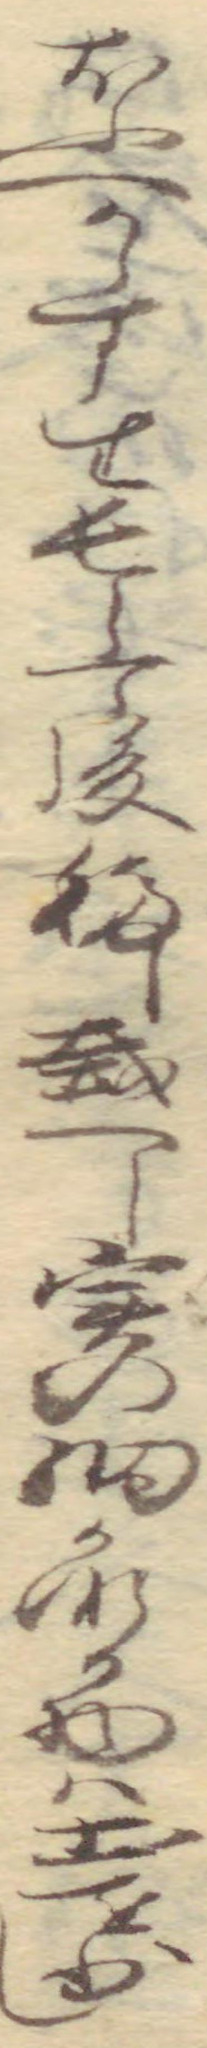ほふへからす生長して後移し栽へし実の細かなる物ハ土を少し
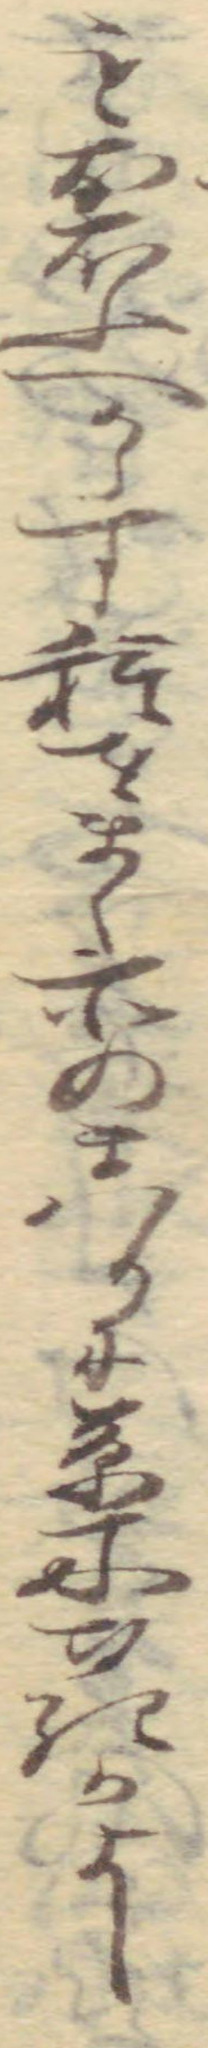もおほふへからす種をまく所のまハりに草木なきかよし
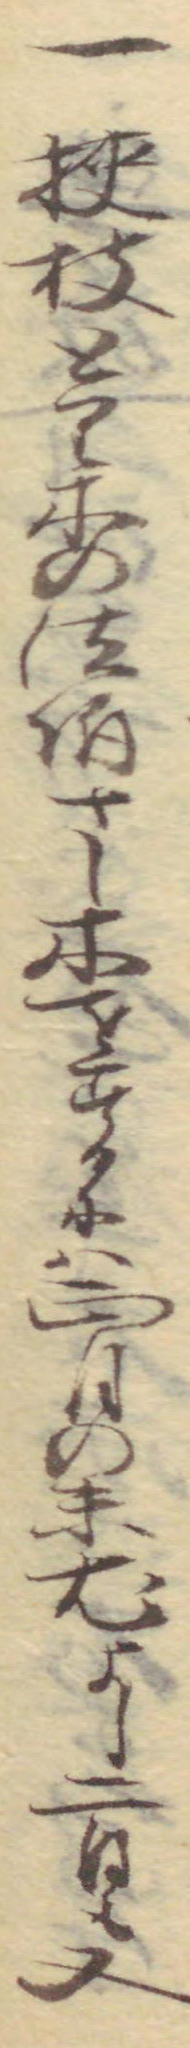一挾枝とり木の法樹さし木をするにハ正月の末尤よし二月も又
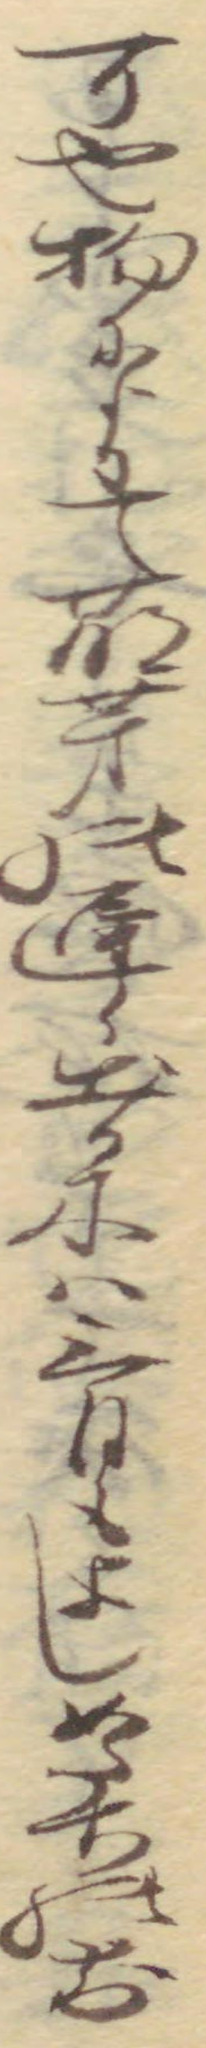可也物によりて萌芽の遅く出る木ハ三月もよしめたちの前
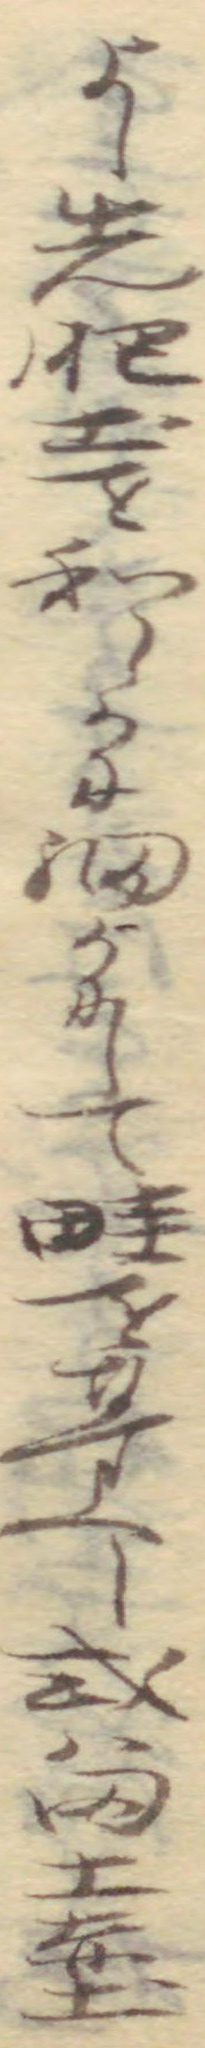よし先肥土を和らかに細がにして畦をなすへし或ハ田土赤土
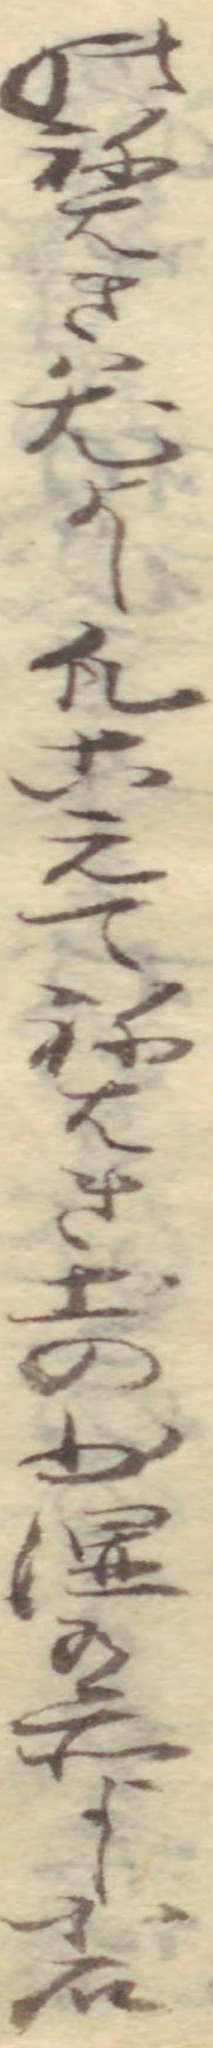のねはきハ尤よし凡こえてねはき土の少湿有所よし小石
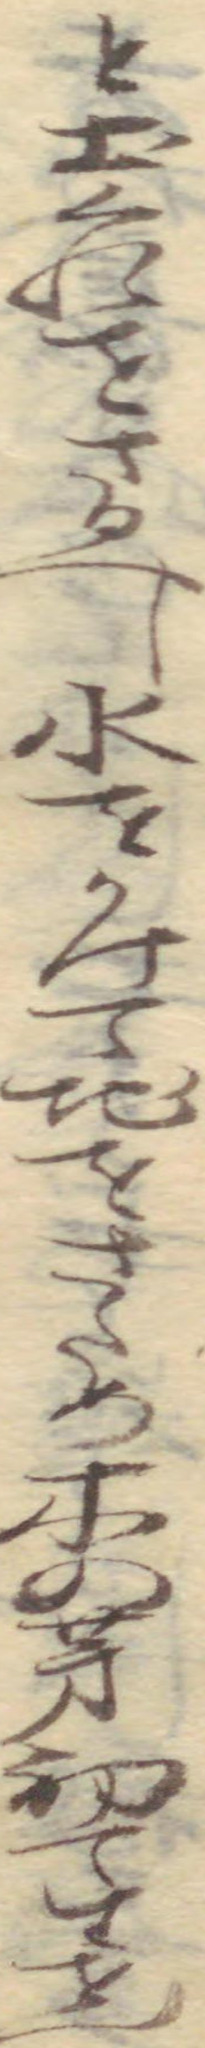と土くれをさるへし水をかけて地をさため木の芽初て生せん
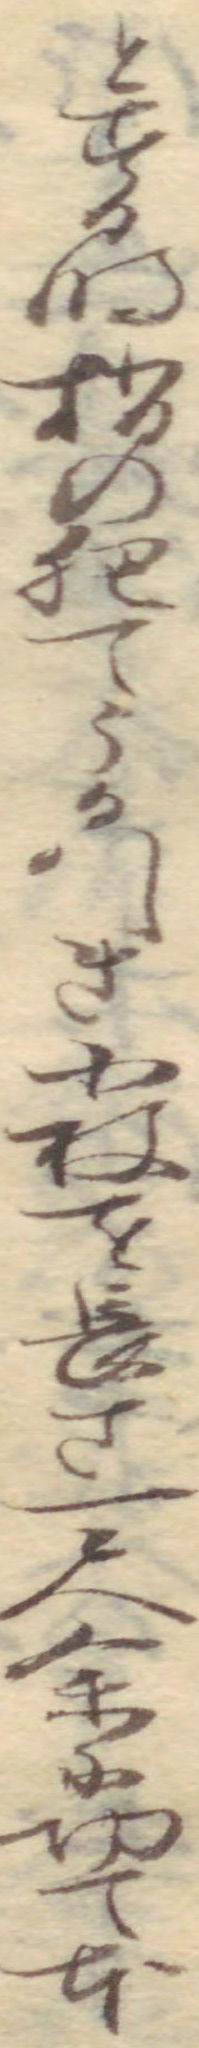とする時梢の肥てうるハしき小枝を長さ一尺余に切て本
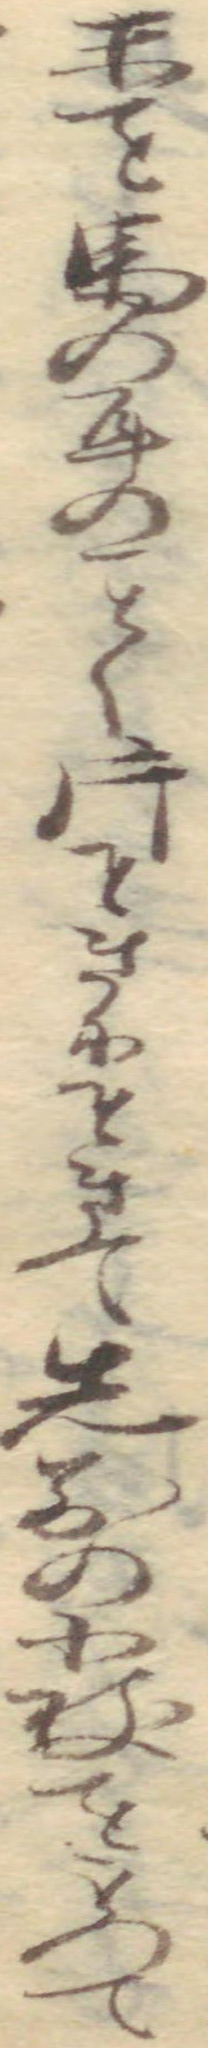末を馬の耳のことく片そきにそきて先別の小枝をもつて
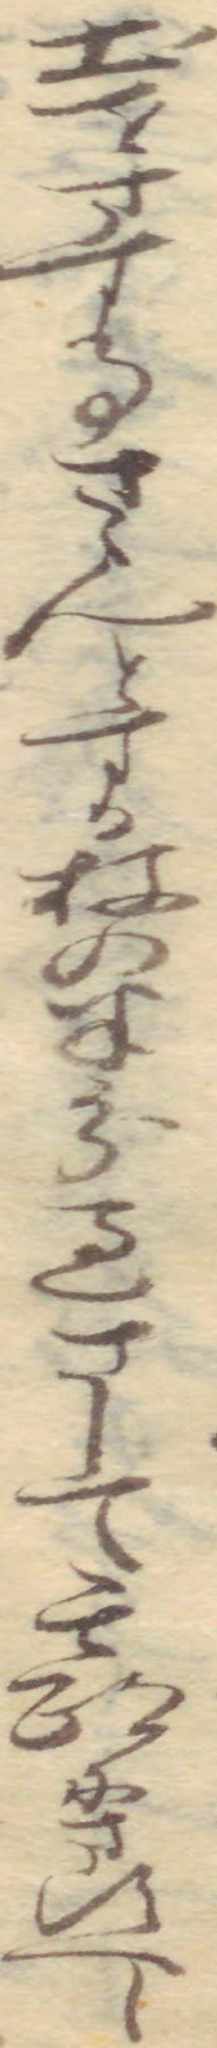土をさす事さゝんとする枝の半分過さして其跡にさすへし
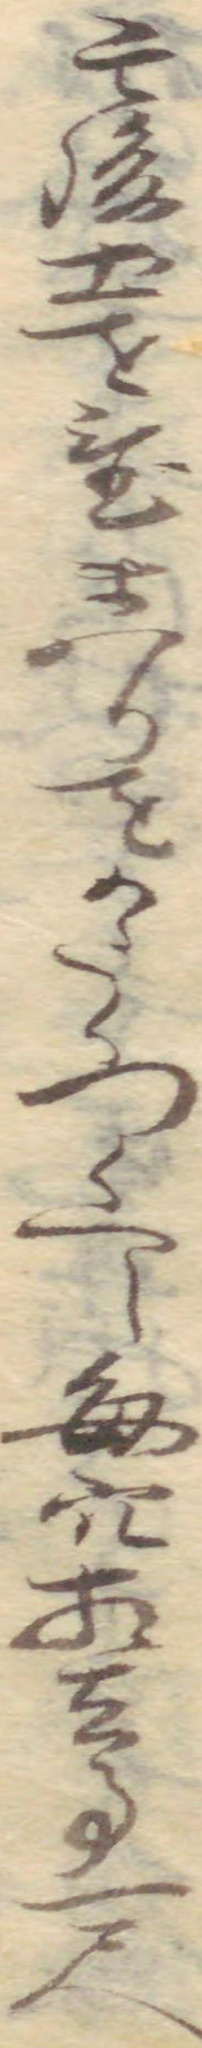其後土を置まハりをかたくつくへし毎穴相去事一尺
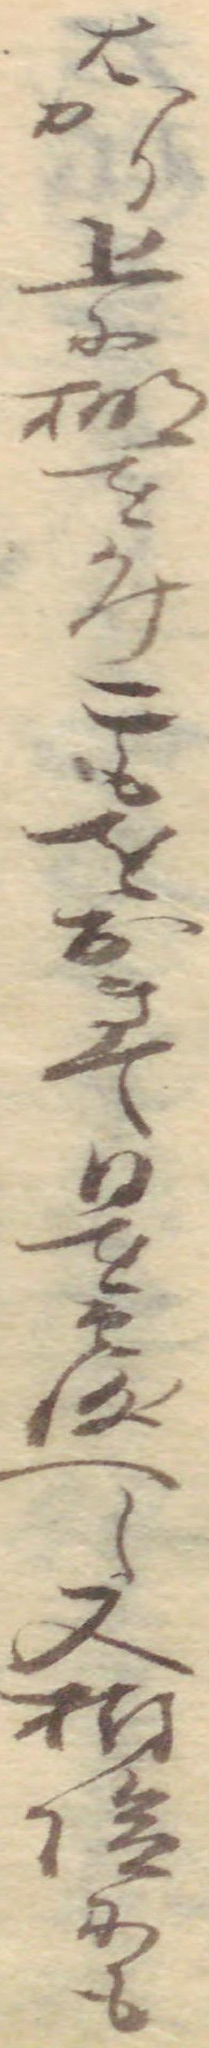はかり上に棚をかけこもをおきて日を覆へし又折塩にも
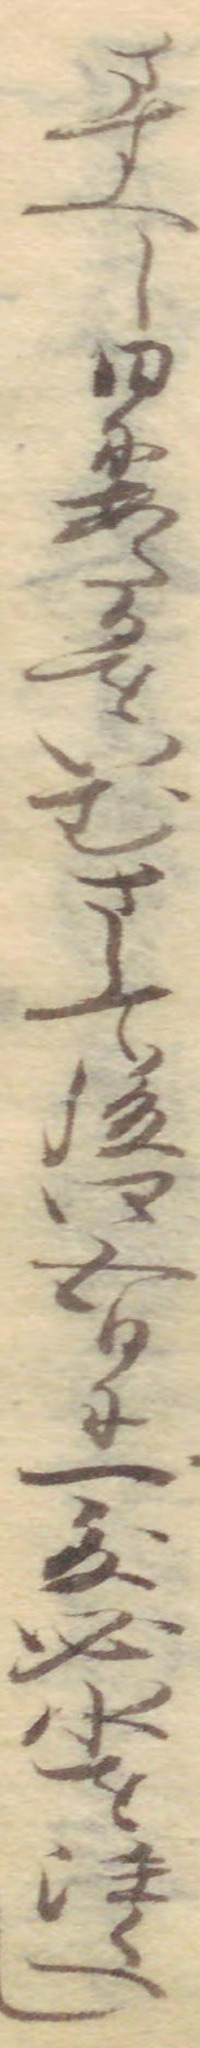さすへし日にあたるをいむさして後四五日に一度必ず水を注くへし
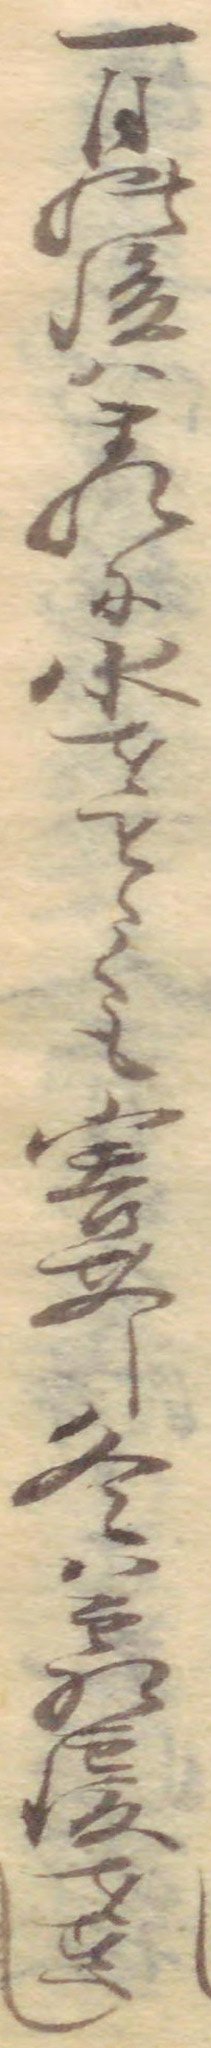一月の後はまれに水をそゝくも害なし冬ハ霜覆をすへし

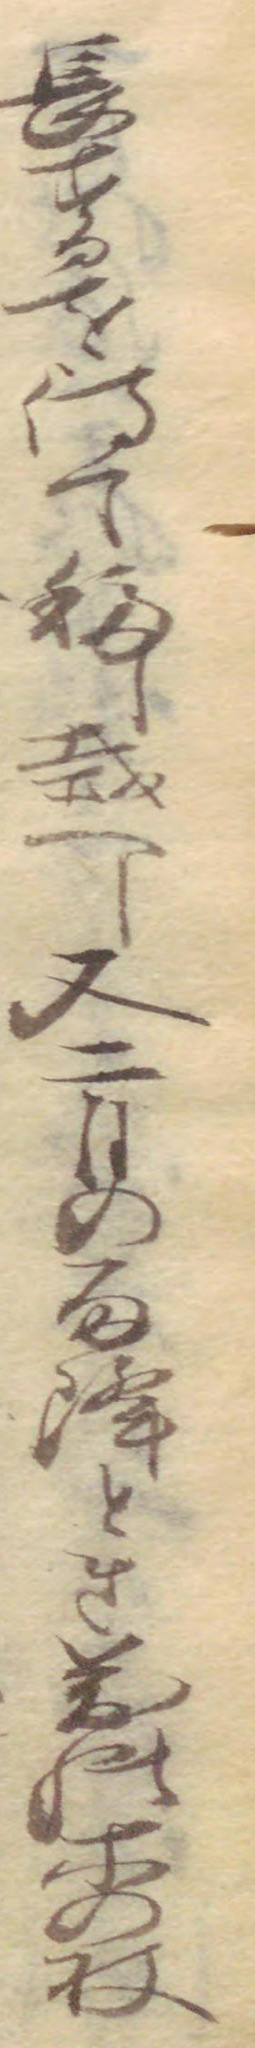長するを待て移し栽へし又二月の雨降とき萬の木の枝
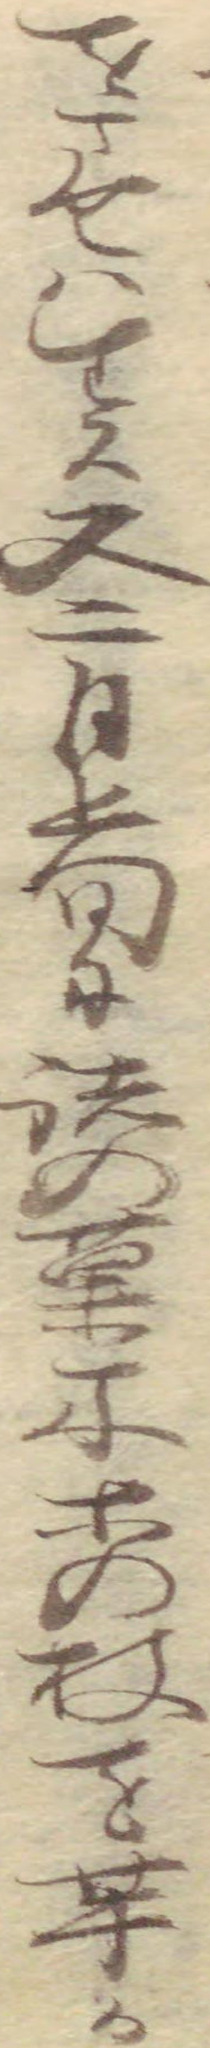をさせは生す又二月上旬に諸の菓木等の枝を芋か
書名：鶯宿雑記. 巻199-200
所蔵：国立国会図書館 National Diet Library, JAPAN
